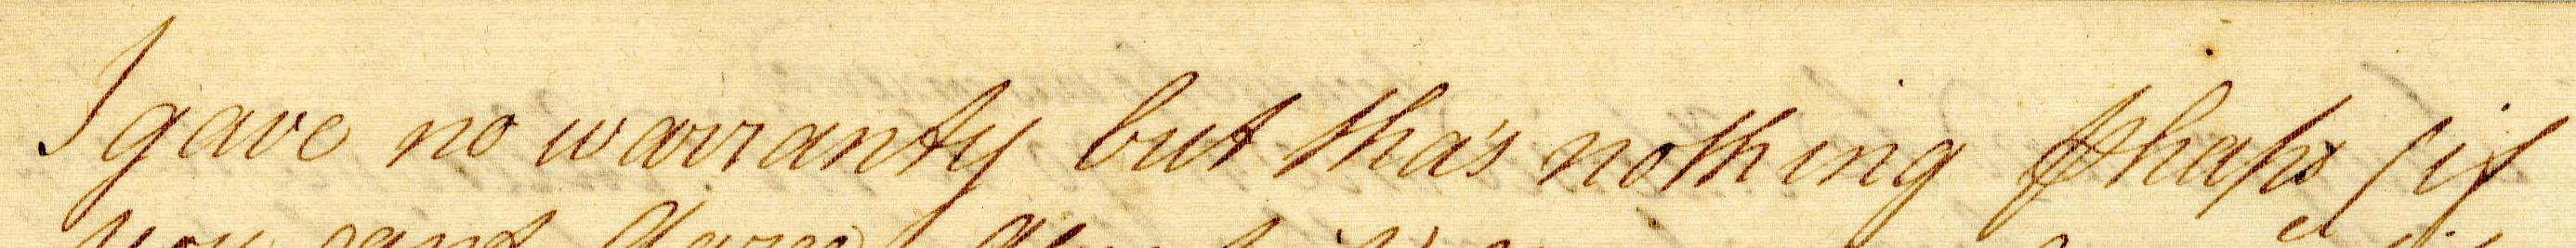I gave no warranty but thas nothing perhaps (if
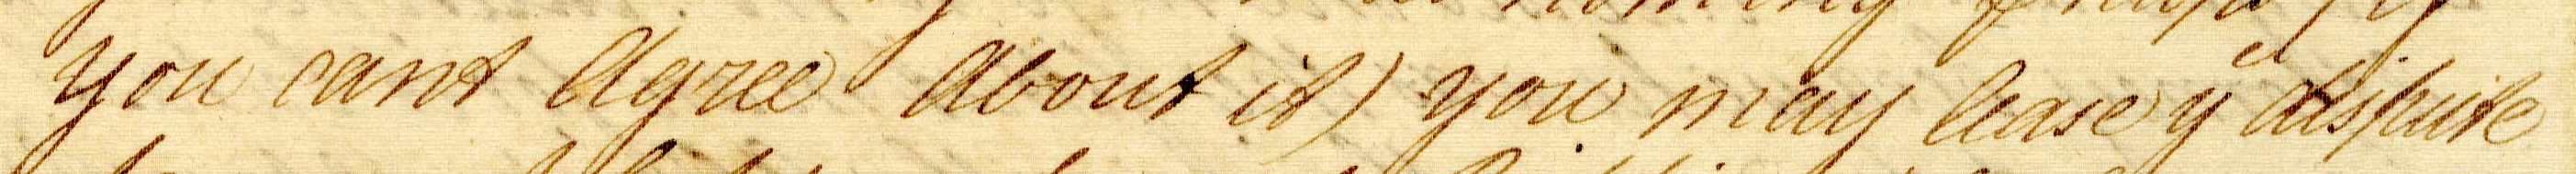You cant Agree About it) you may lease y^e dispute
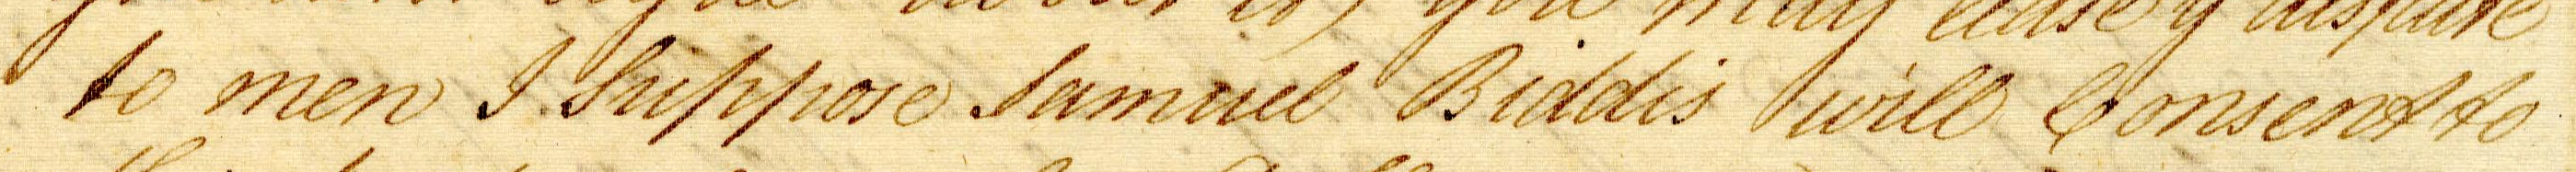to men I suppose Samuel Biddis will Consent to
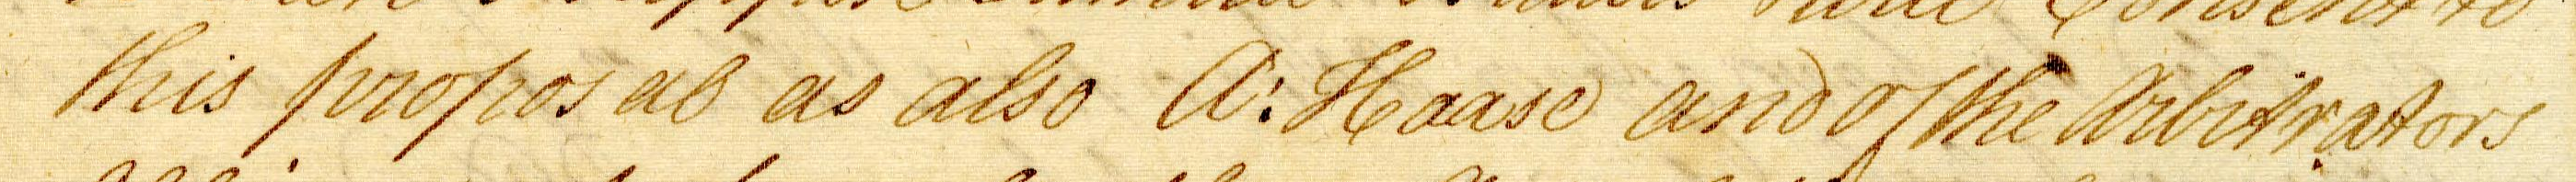this proposal as also A: Haase and of the Arbitrators
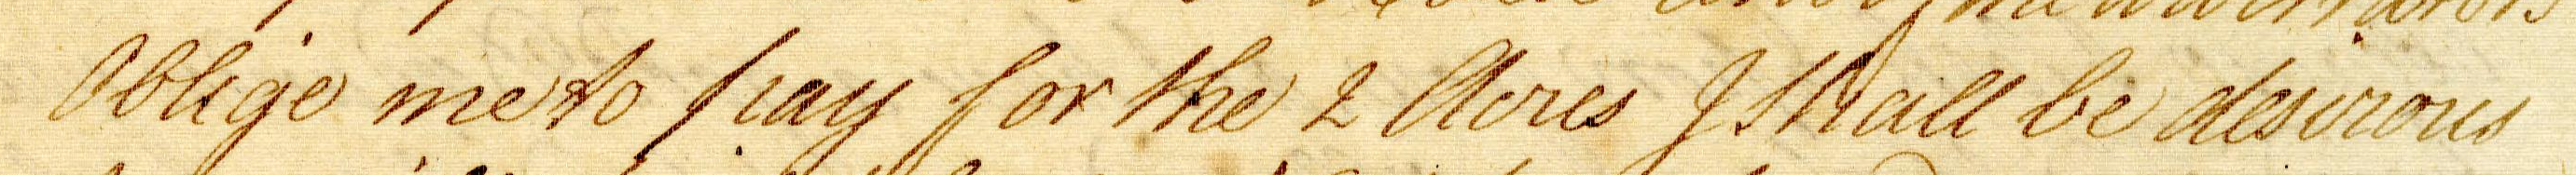Oblige me to pray for the 2 Acres I shall be desirous
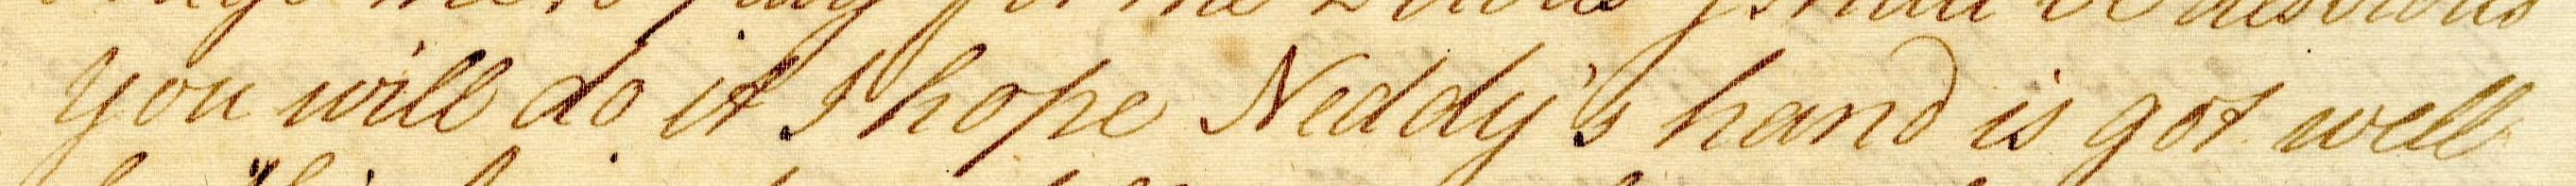You will do it I hope Neddy's hand is got well
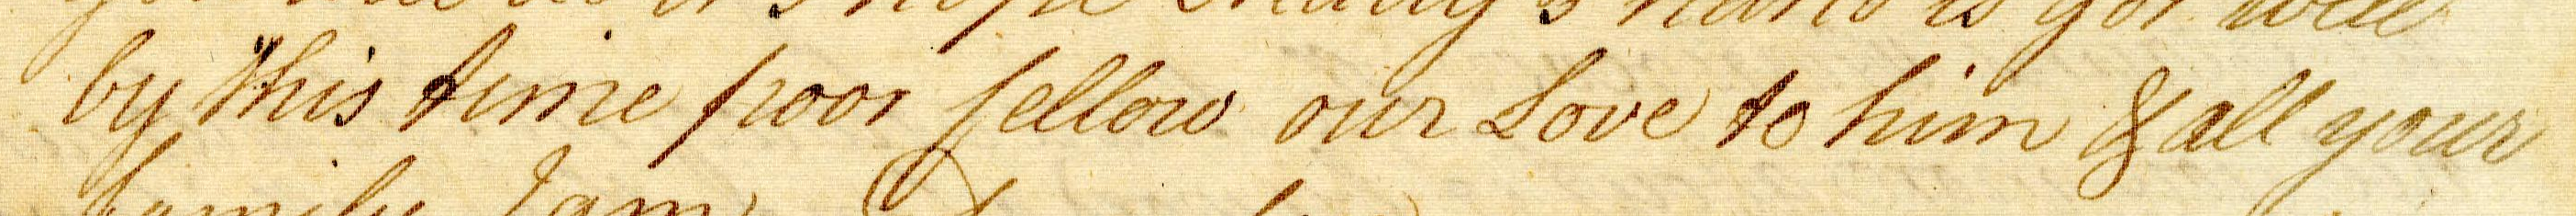by this time poor fellow our Love to him & all your
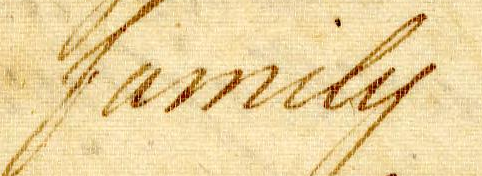family
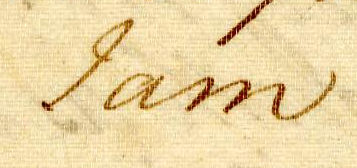I am
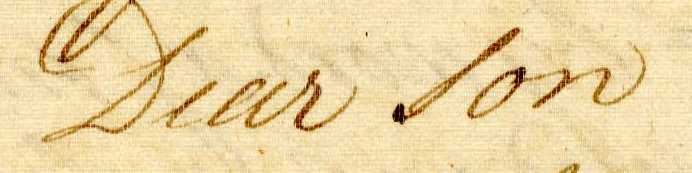Dear son
